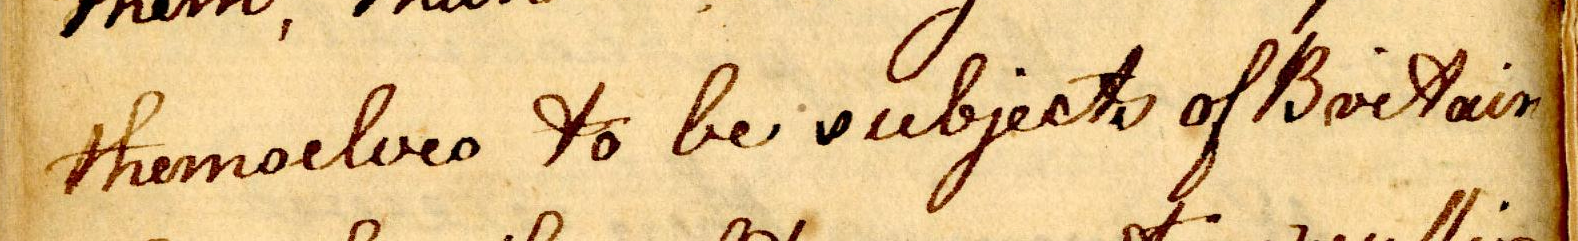themselves to be subjects of Britain
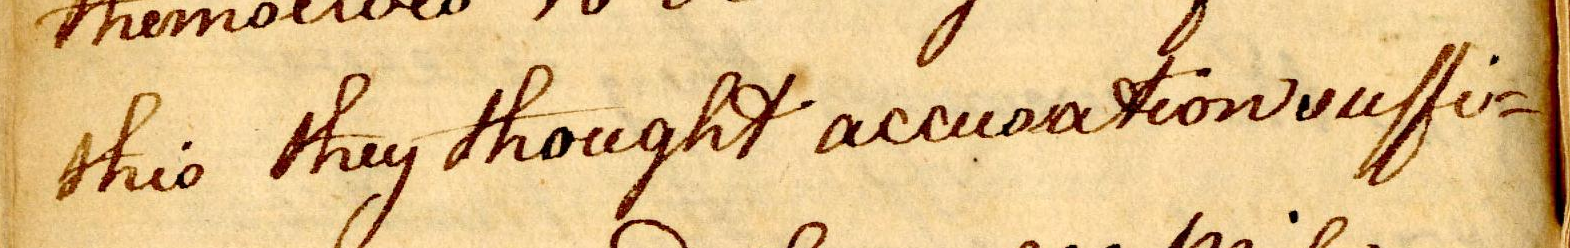this they thought accusation suffi-
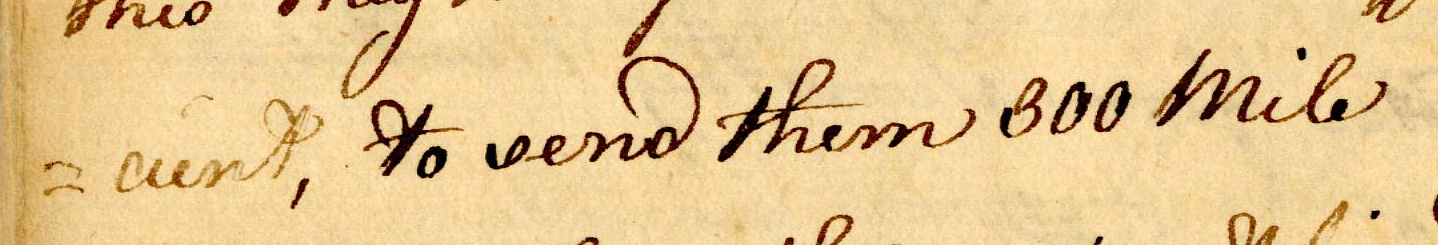-cient, to send them 300 Mile
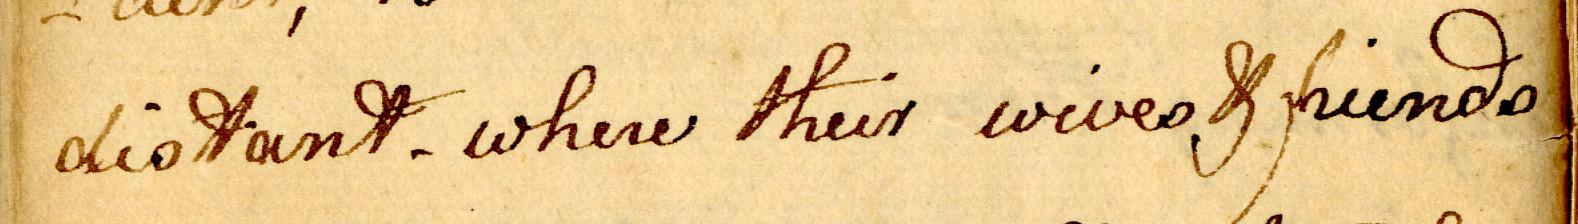distant. where their wives & friends
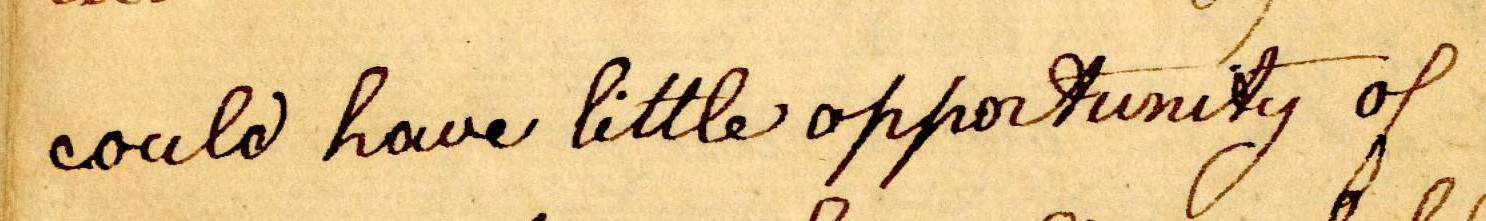could have little opportunity of
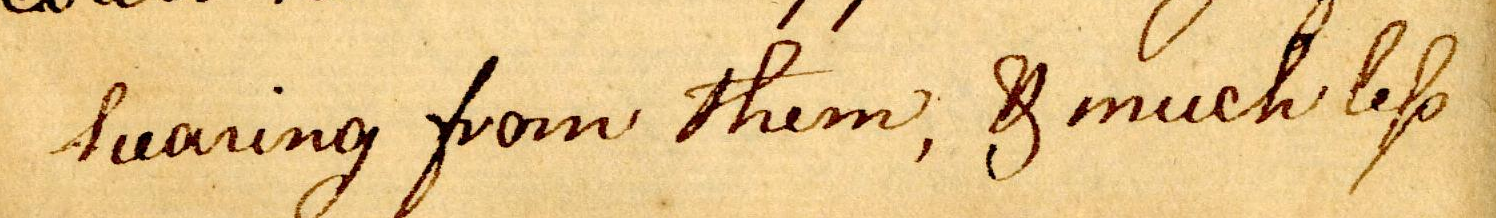hearing from them, & much less
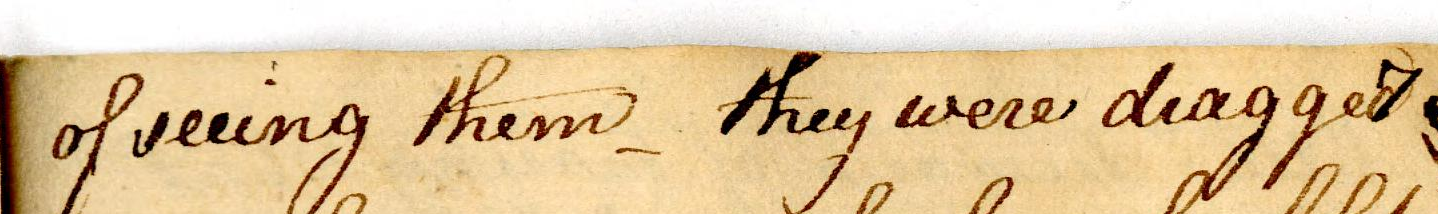of seeing them- they were dragged
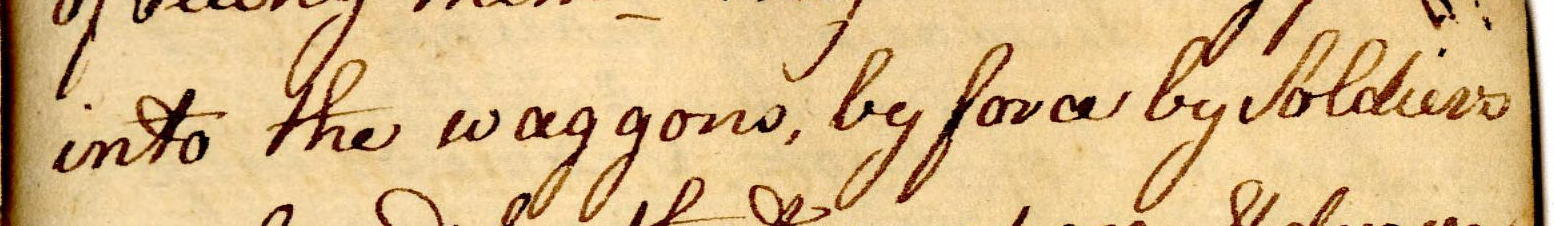into the waggons, by force by Soldiers
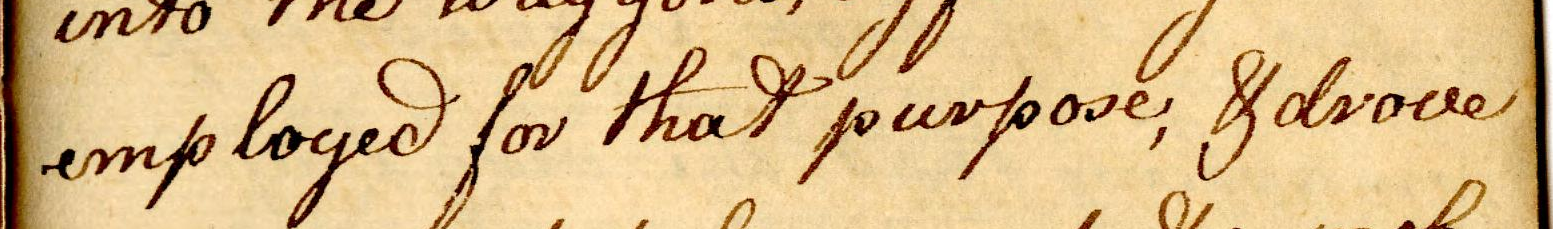employed for that purpose, & drove
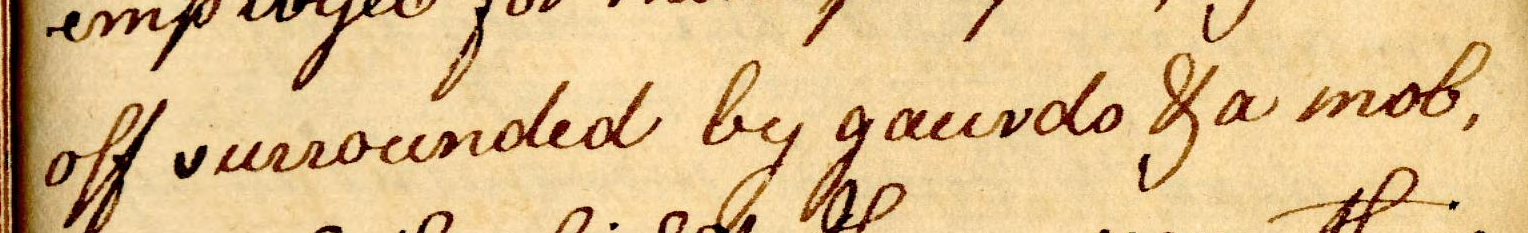off surrounded by gaurds & a mob,
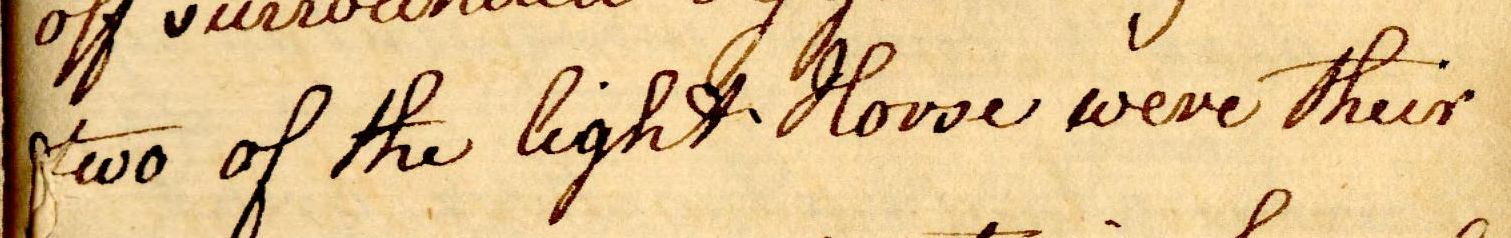two of the light Horse were their
